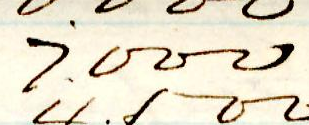7.000
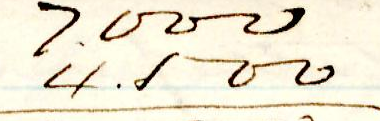4.100
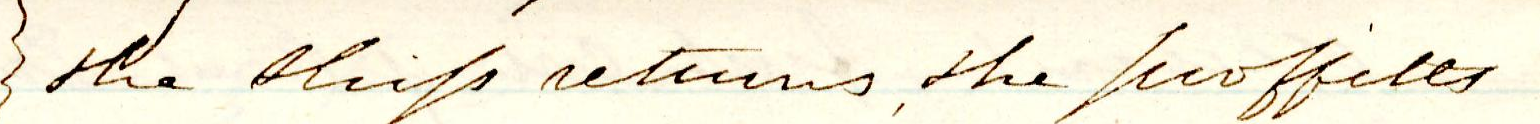the ships return, the proffitts
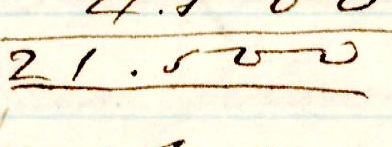21.500
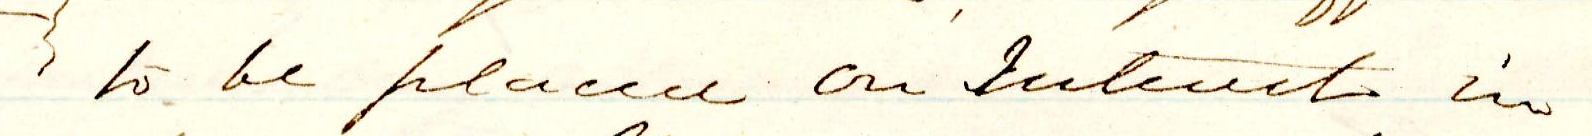to be placed on Interest in
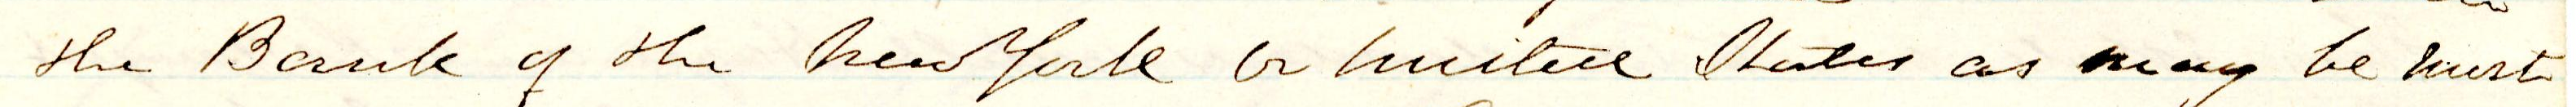the Bank of the New York or United States as may be most
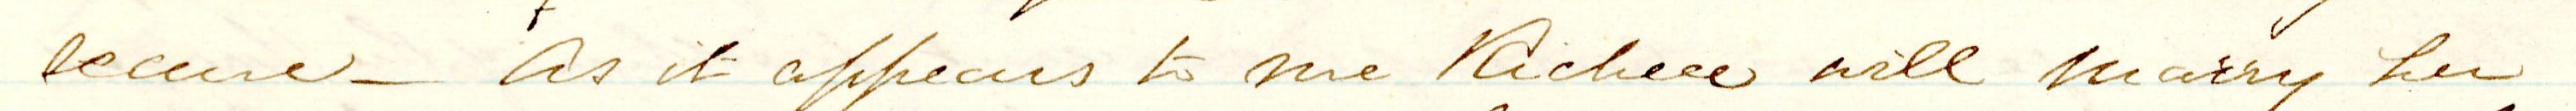secure.- As it appears to me Rachael will marry her
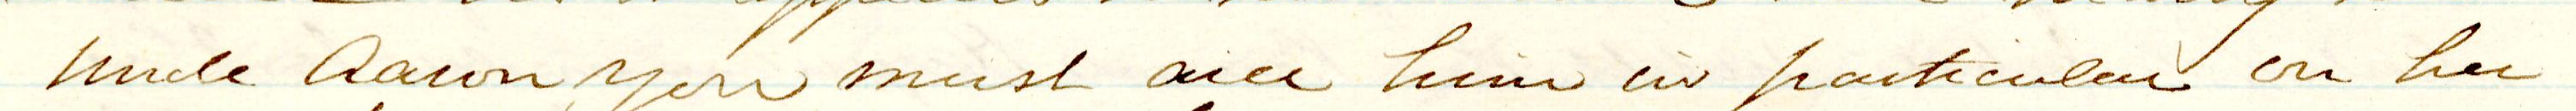Uncle Dawn you must aid him in particular on her
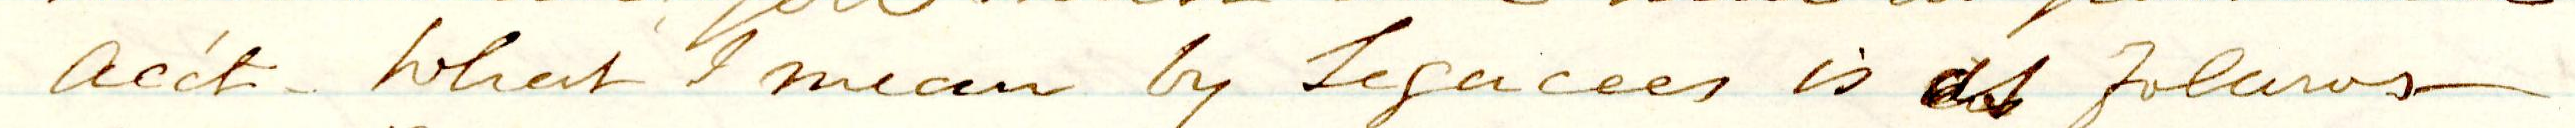Acct- what I mean by Legacees is as follows
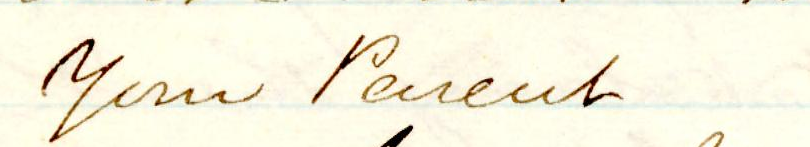Your parent
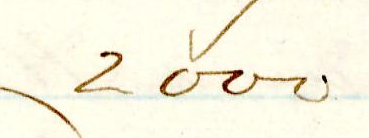2000
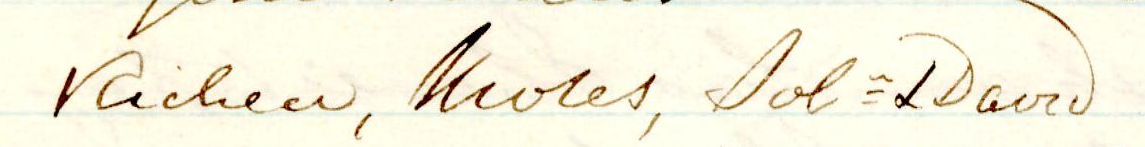Richea, Moses, Sol & David
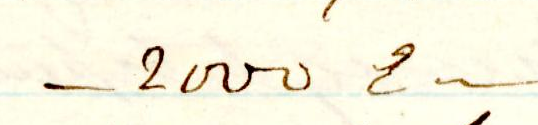-2000 s-
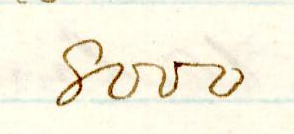8000
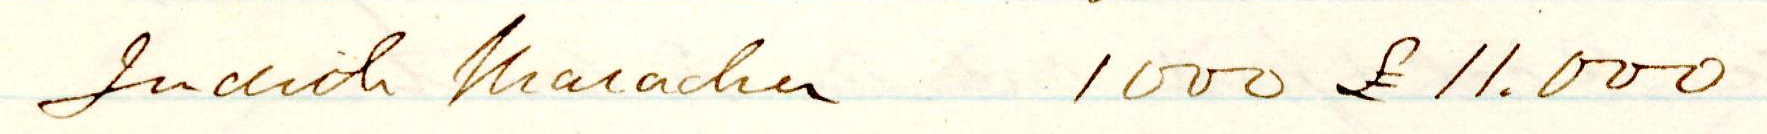Judith Maracher 1000 £11.000
